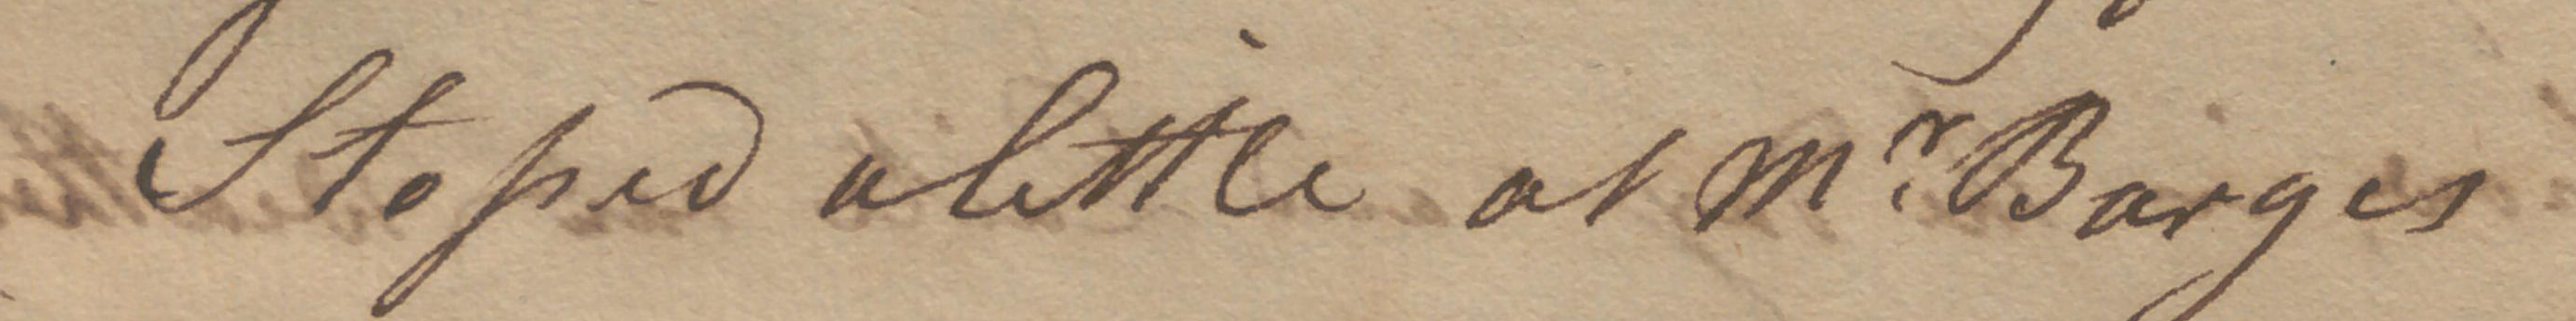Stoped a little at M^r. Barges
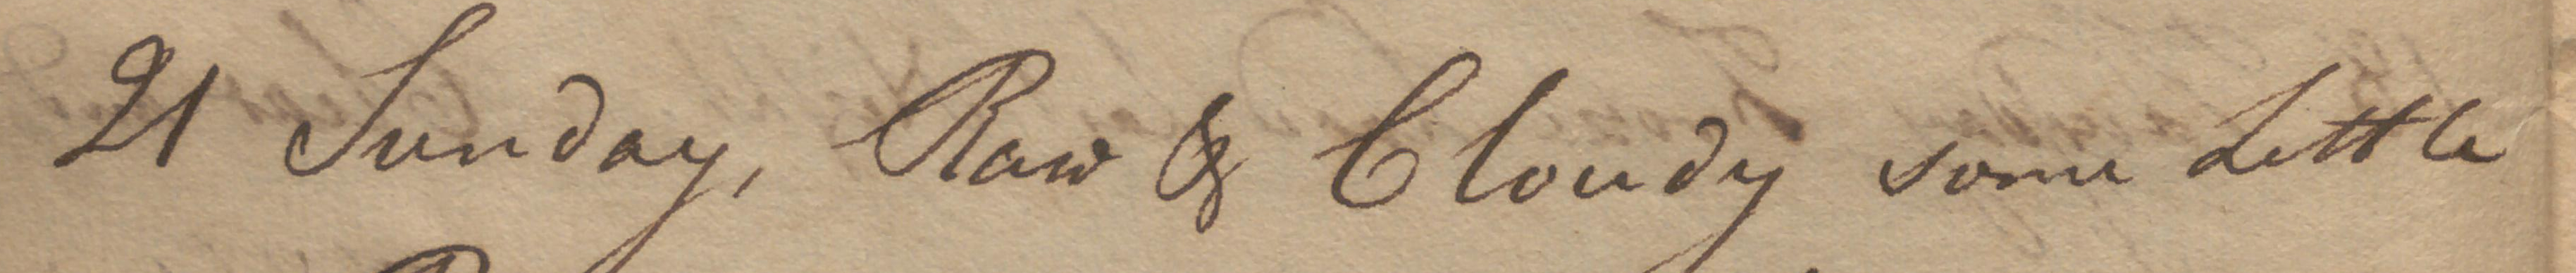21 Sunday, Raw & Cloudy some Little
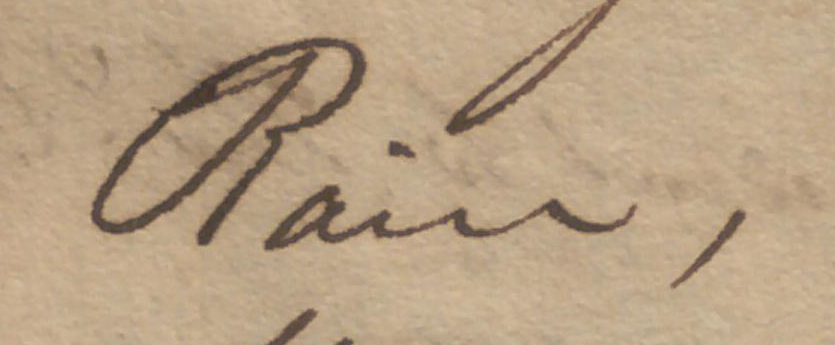Rain,
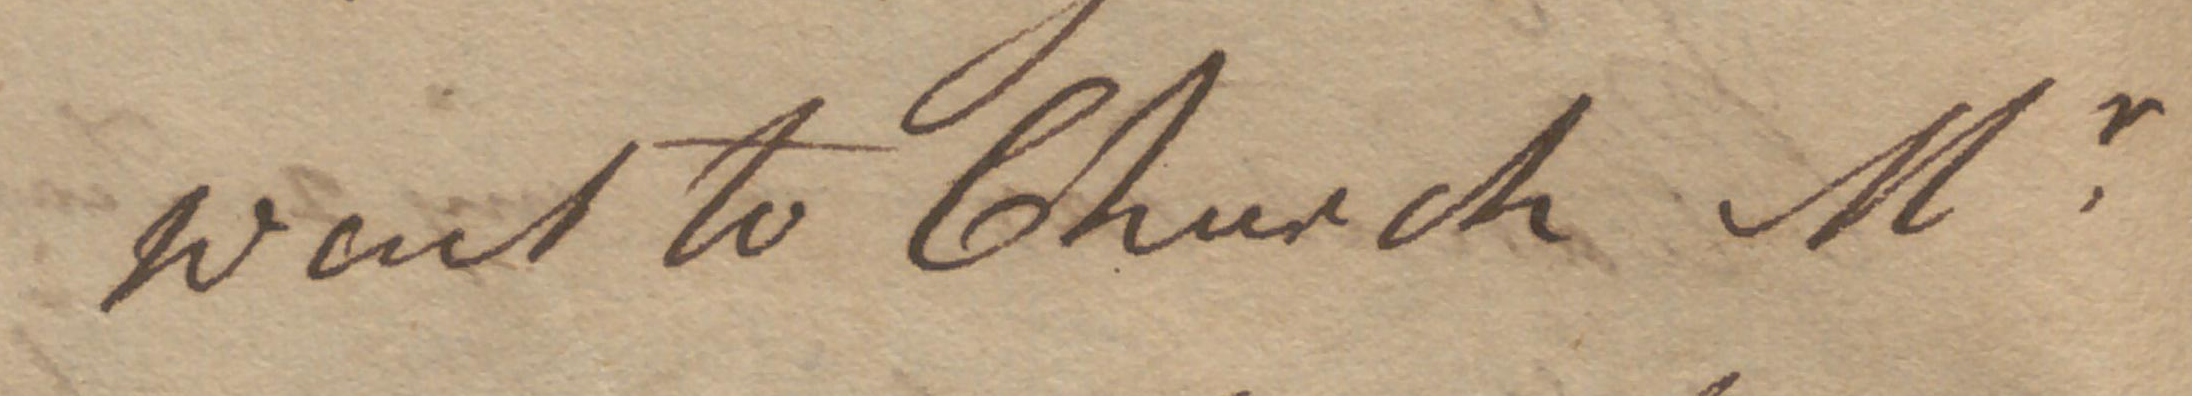went to Church M^r.
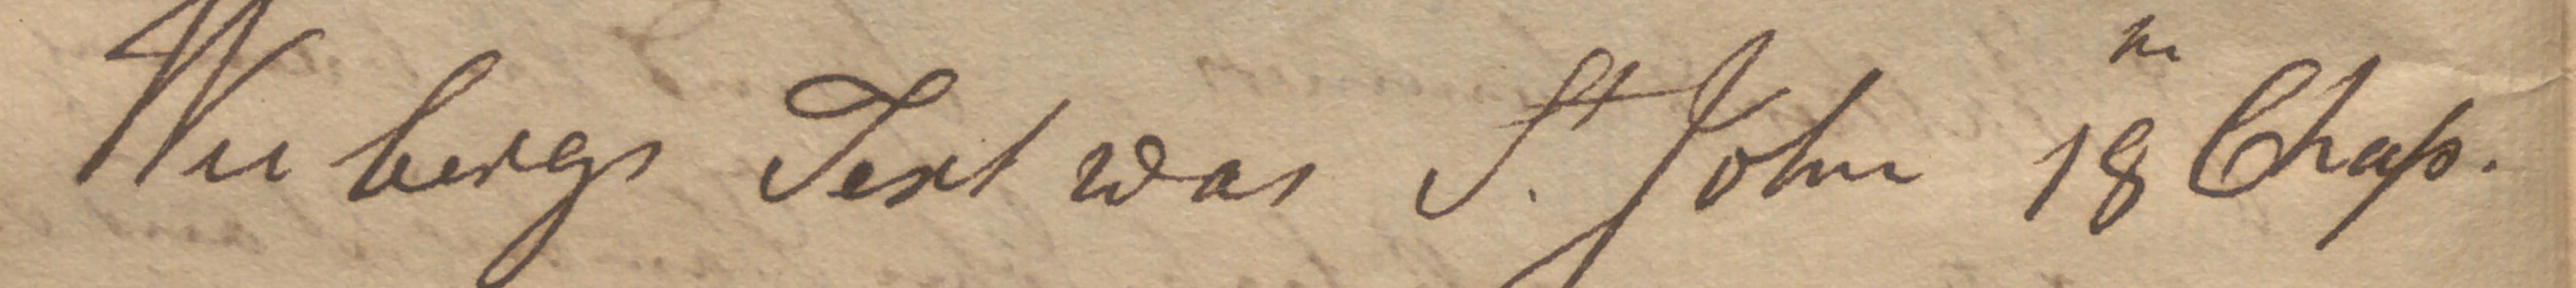Wubergs Text was S^t. John 18^th Chap.
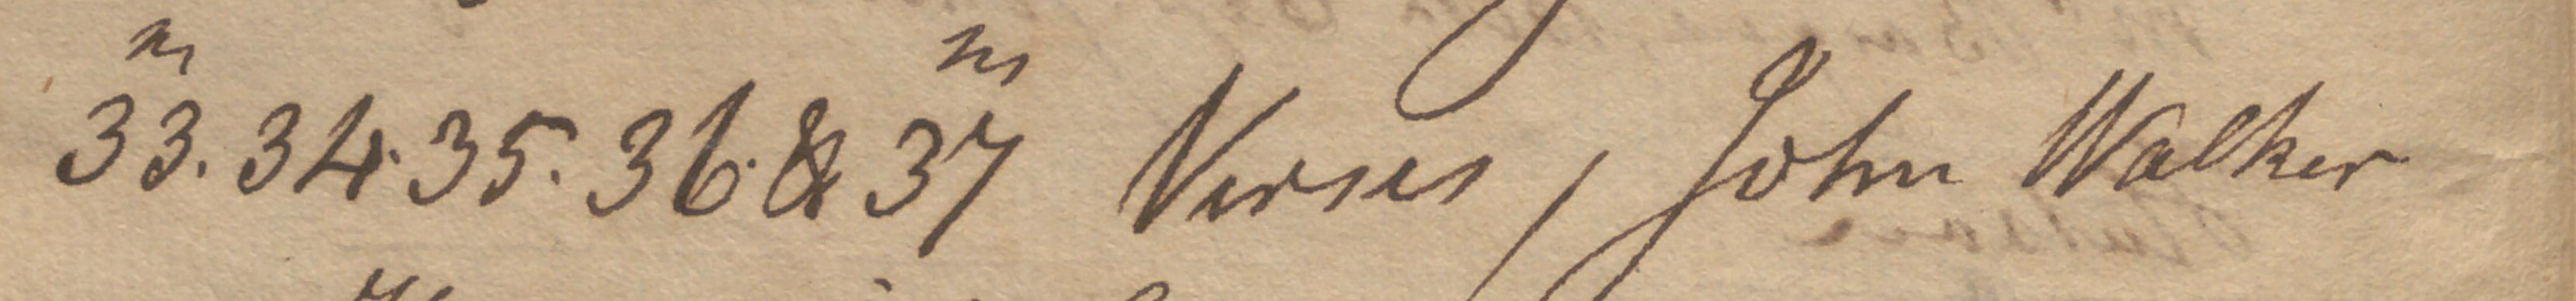33.34.35.36. & 37 Verses John Walker
